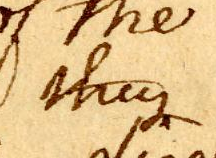they
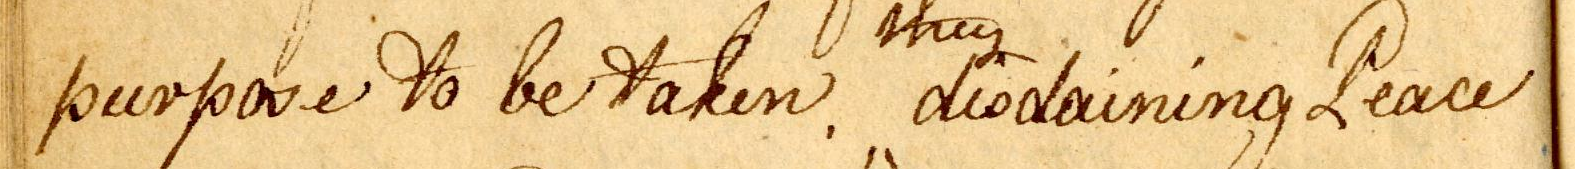purpose to be taken, ^ disdaining Peace
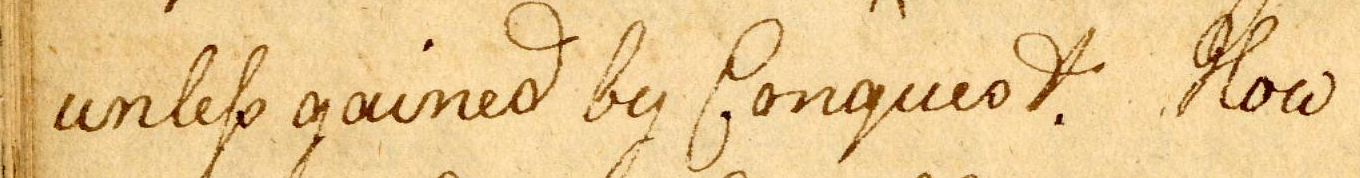unless gained by Conquest. How
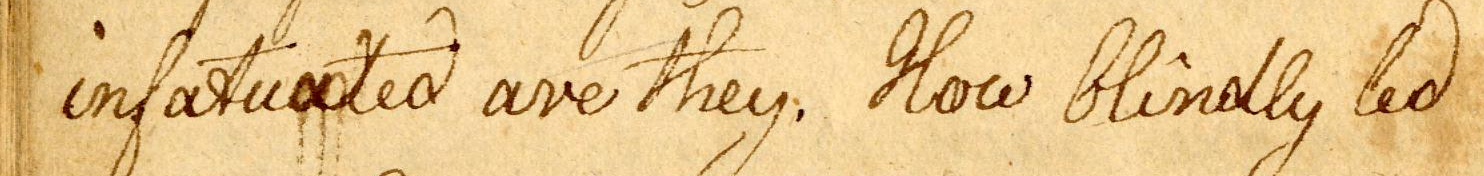infatuated are they. How blindly led
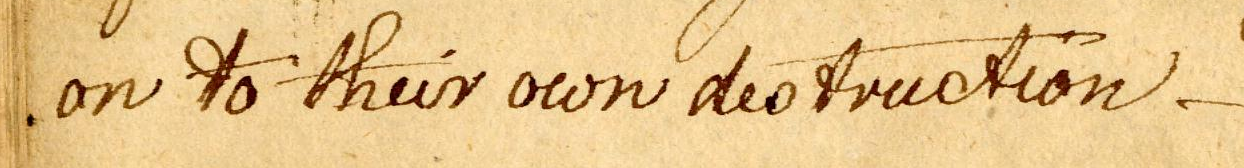on to their own destruction-
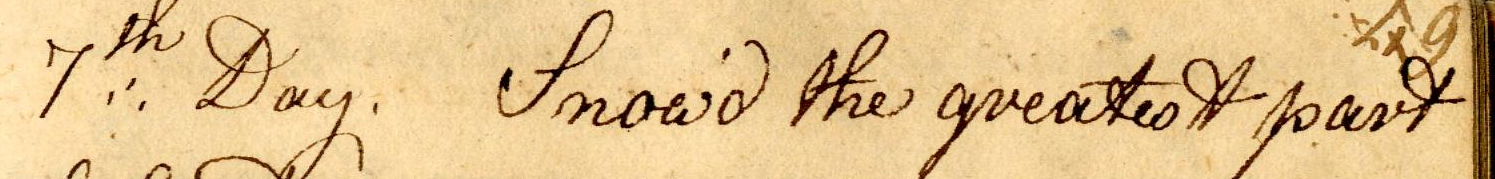7^th Day. Snow'd the greatest part
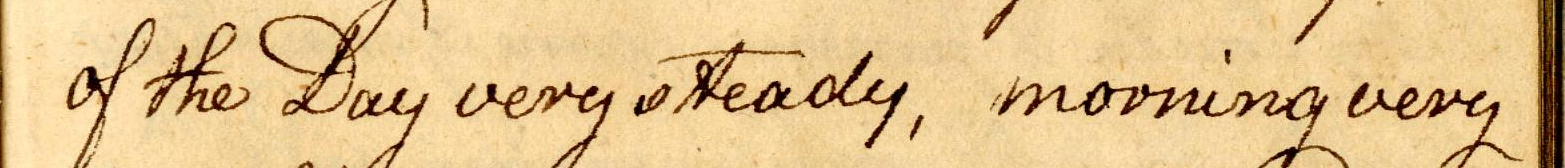of the Day very steady, morning very
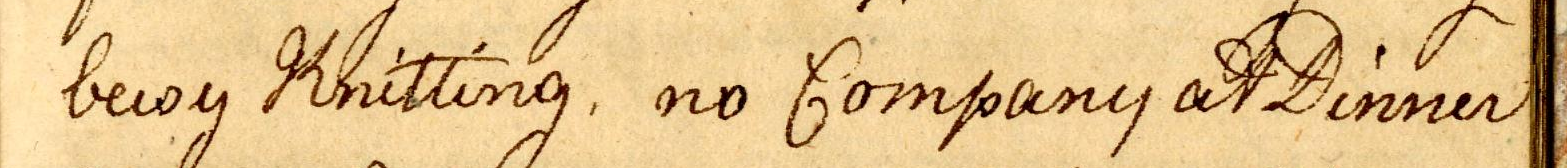busy Knitting, no Company at Dinner
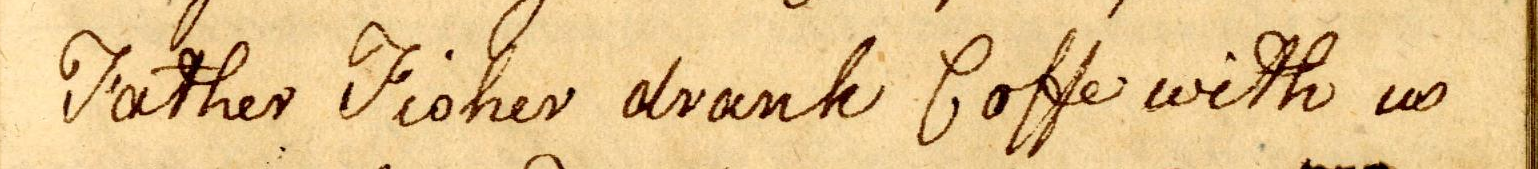Father Fisher drank Coffe with us
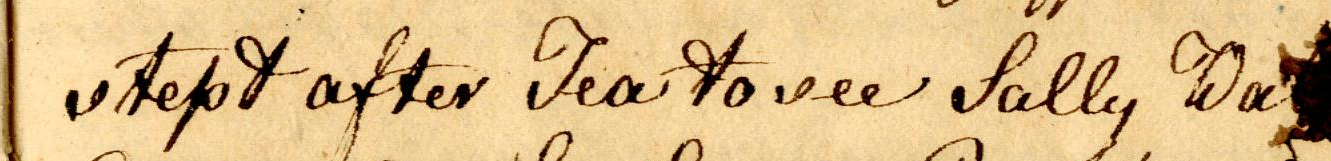stept after Tea to see Sally Wa
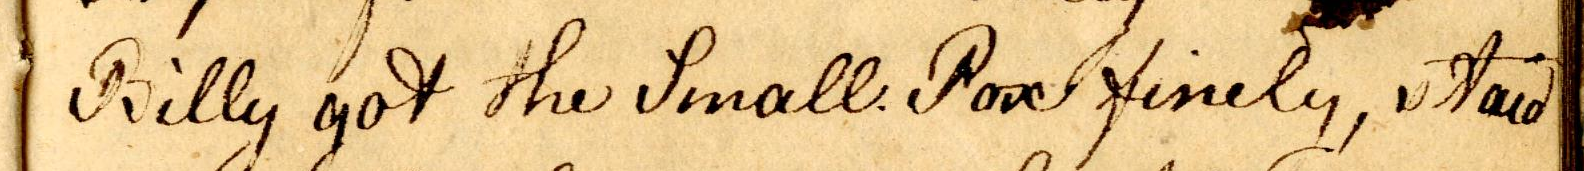Billy got the Small Pox finely, staid
